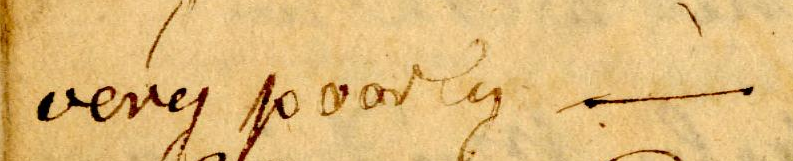very poorly-
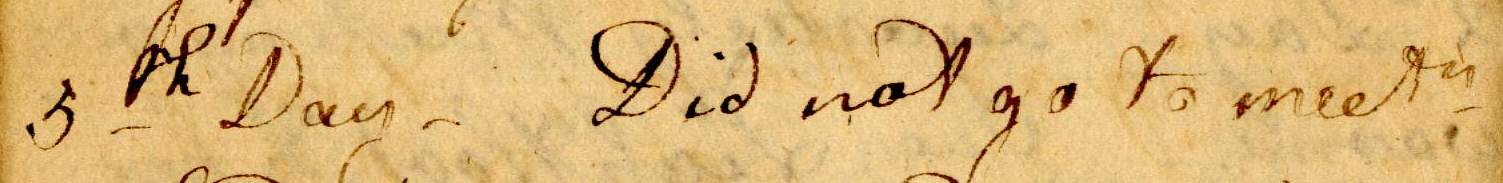5^th Day- Did not go to meet^n
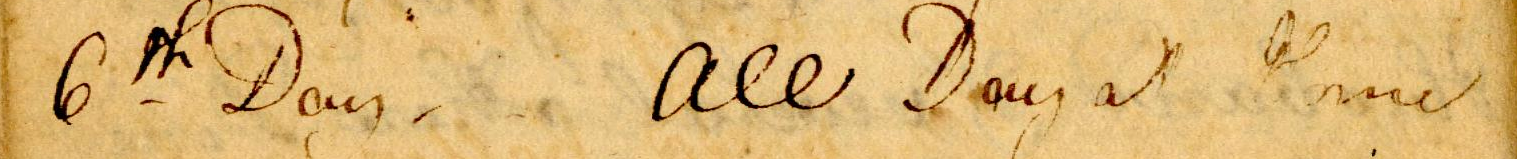6^th Day- All Day at Home
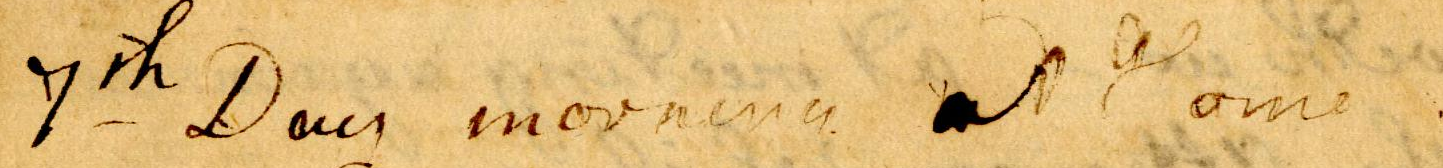7^th Day morning at Home
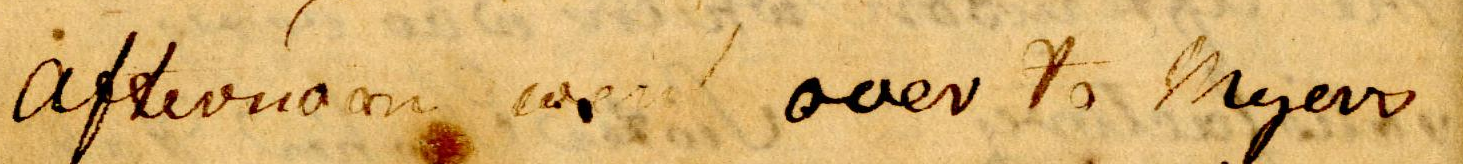Afternoon went over to Myers
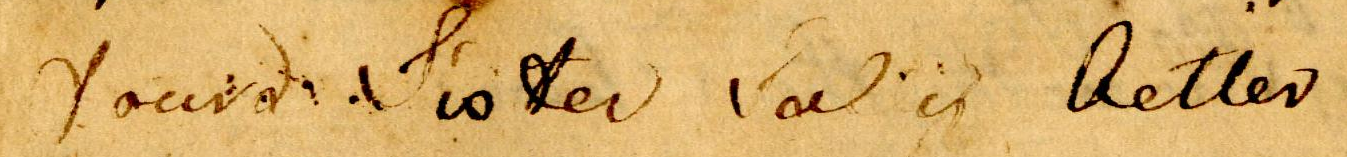found Sister Sally better
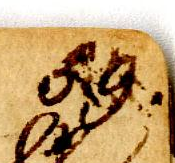59
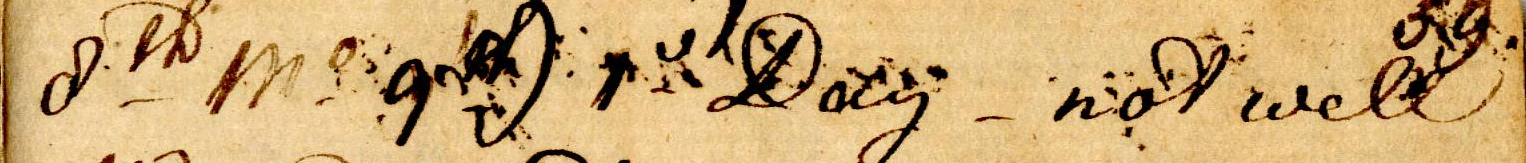8^th M^o 9^th) 1^st Day, not well
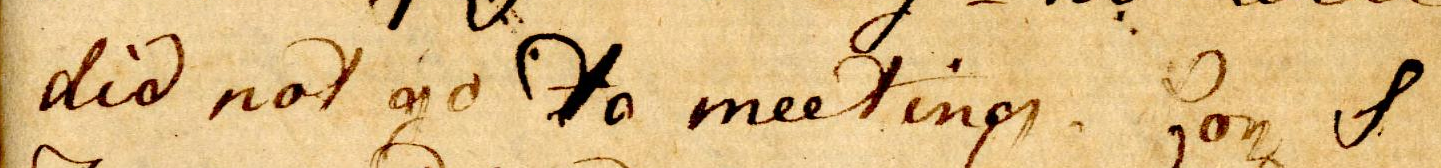did not go to meeting- Coz S
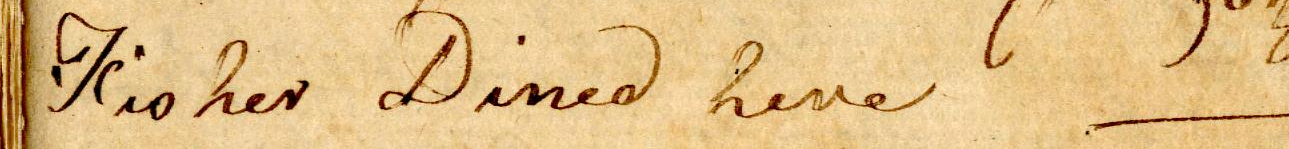Fisher Dined here-
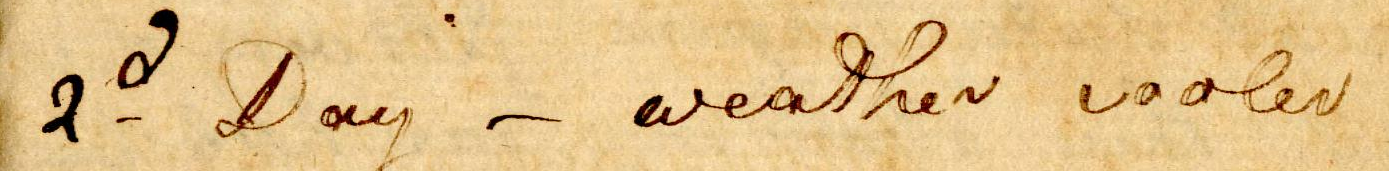2^d Day- weather cooled
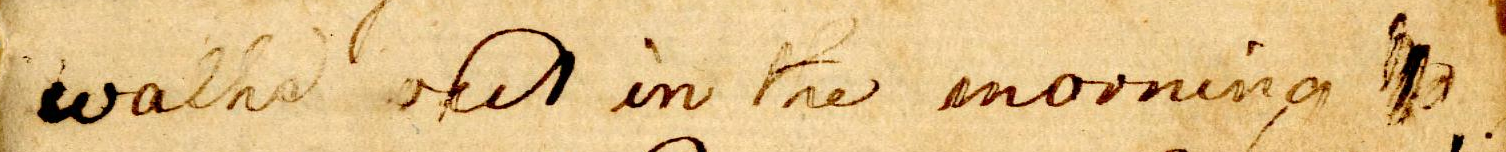walkd out in the morning &
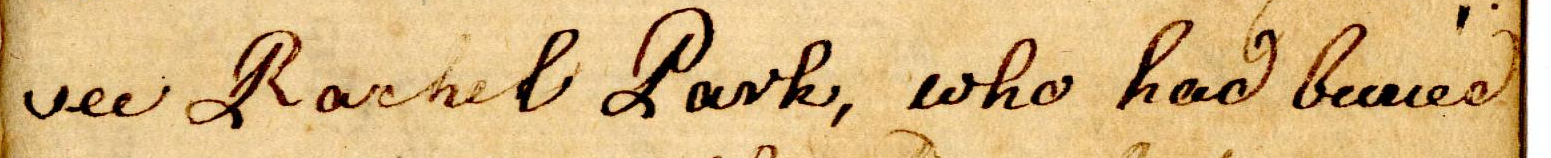see Rachel Park, who had buried
